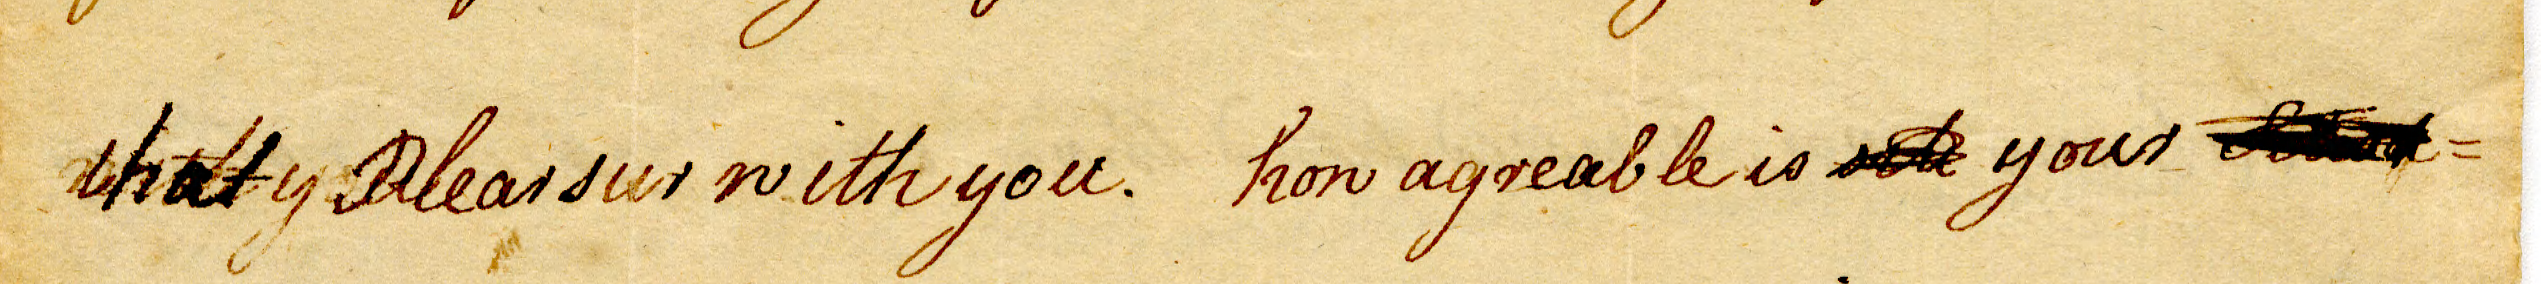that Pleasure with you. how agreeable is [___] your [_____]
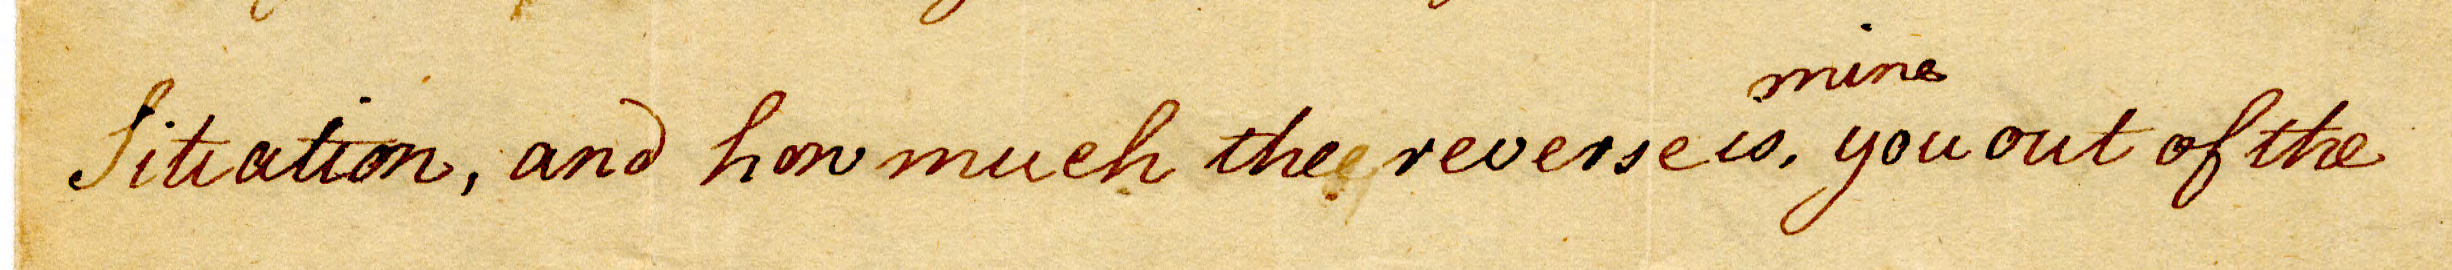Situation, and how much thee reverse is you out of the
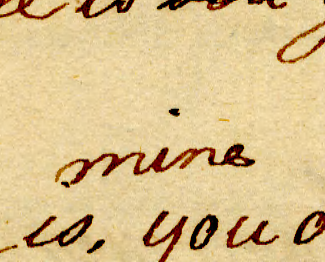mine
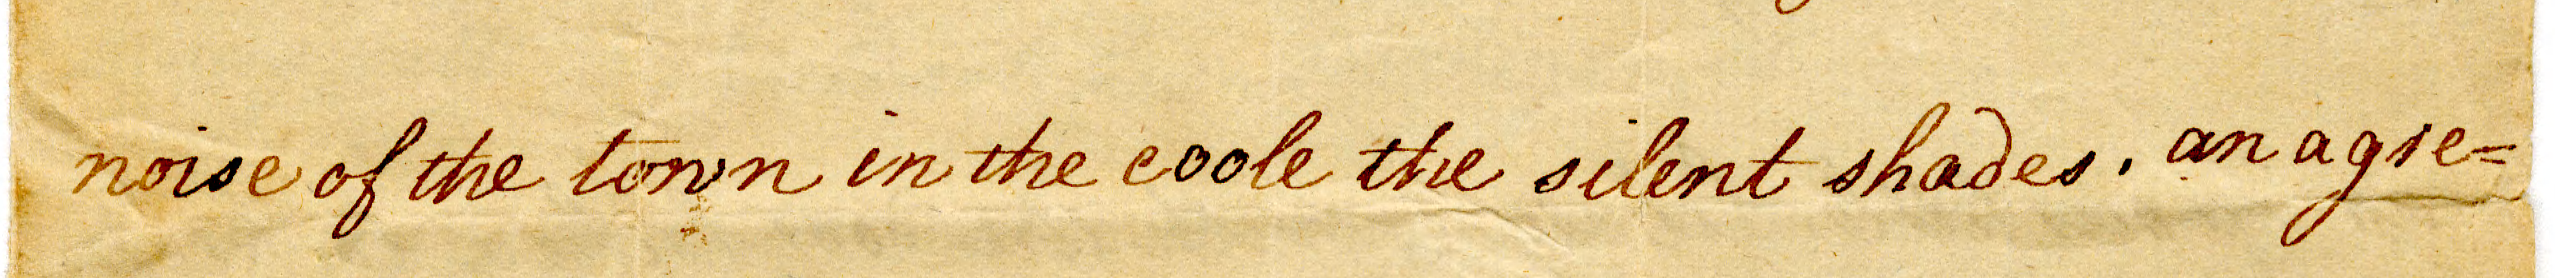noise of the town in the coole the silent shades. an agre-
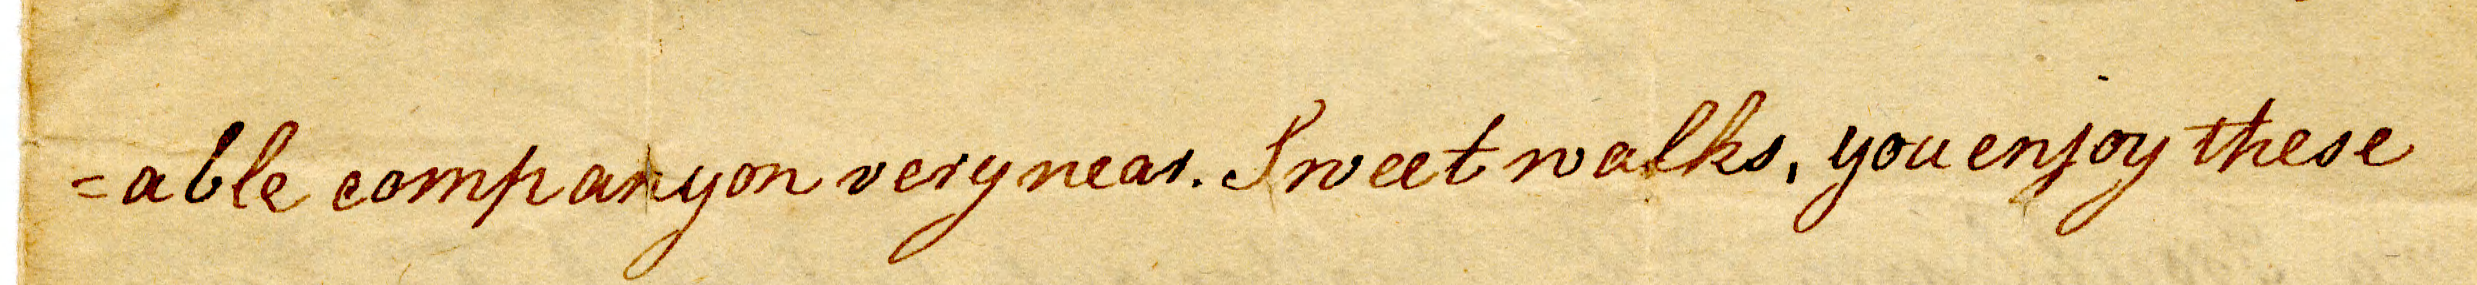-able companyon very near. Sweet walks, you enjoy these
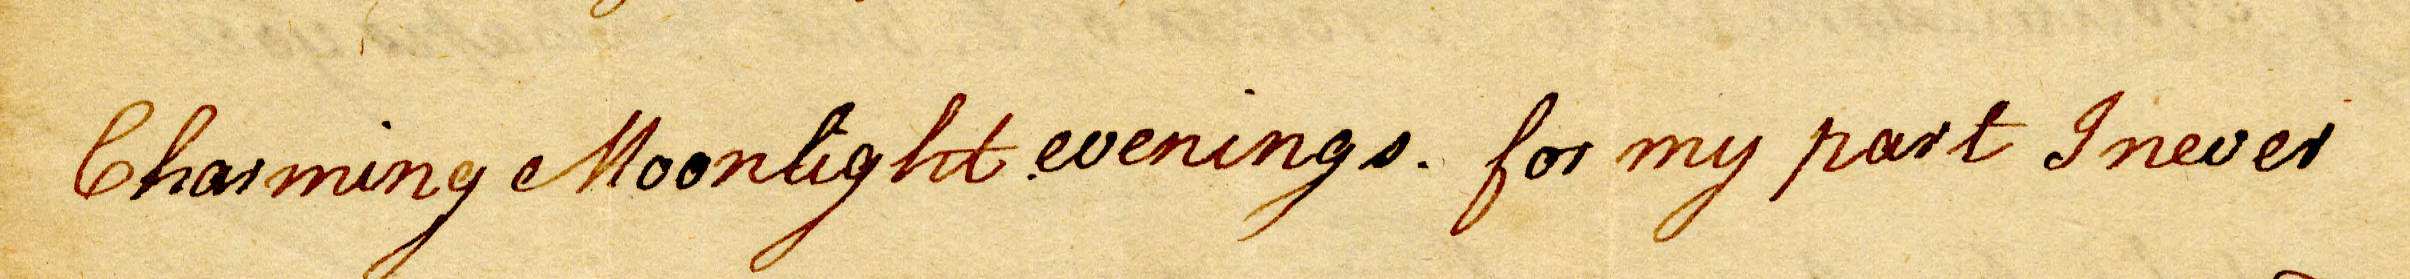Charming Moonlight evenings. for my part I never
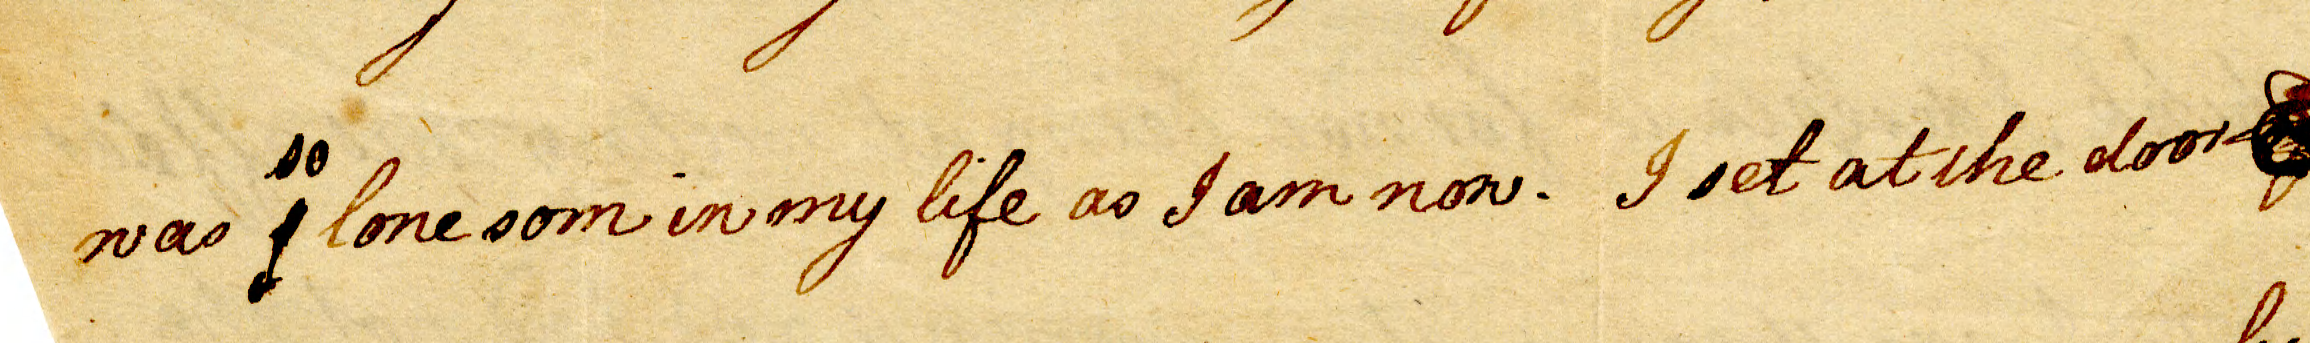was ^so lonesome in my life as I am now. I set at the door
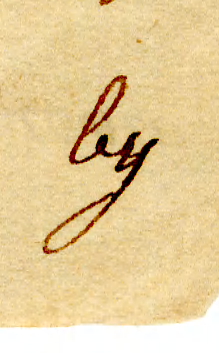by
